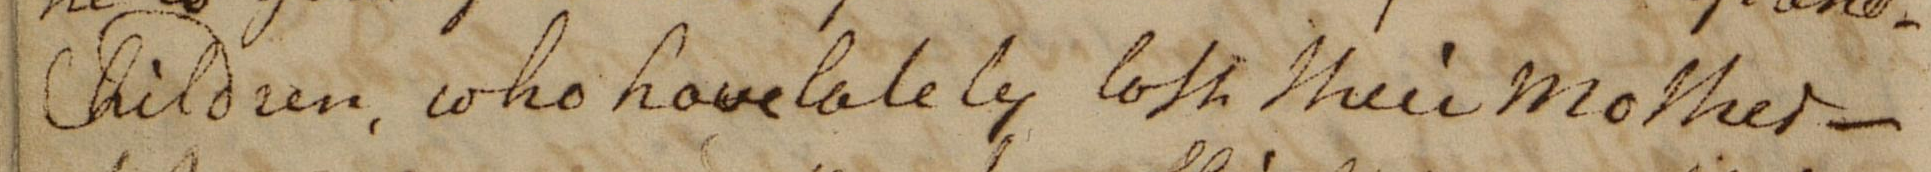Children, who have lately lost their Mother-
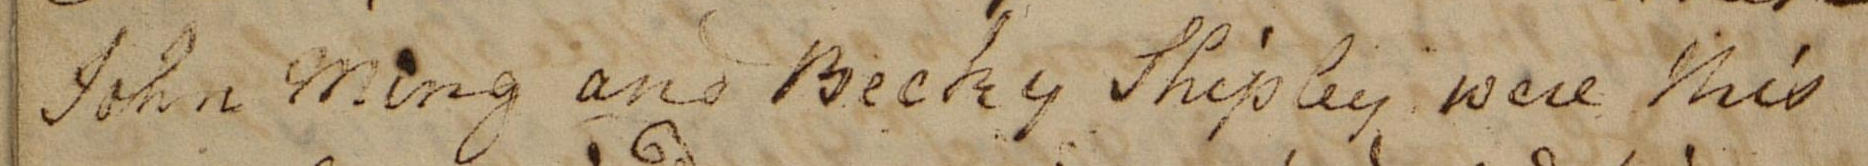John Ming and Becky Shipley were this
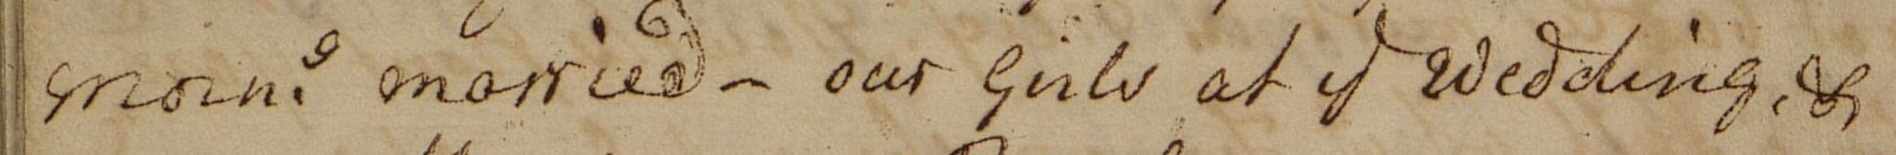Morn.^g married- our Girls at y^e wedding &
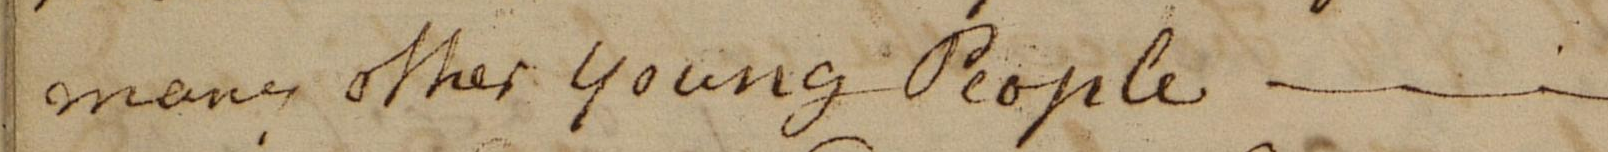many other Young People-
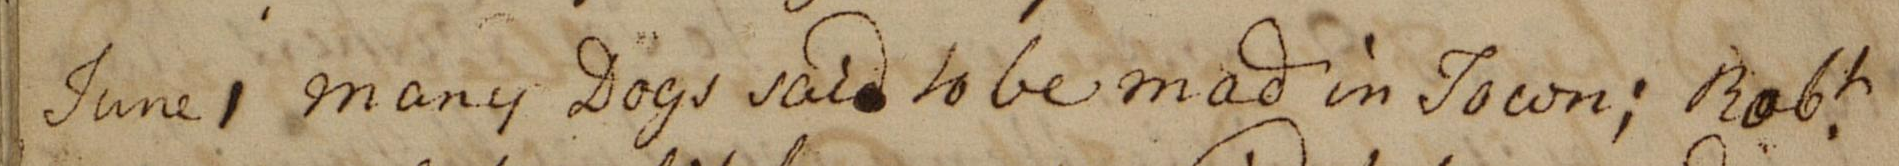June, many Dogs said to be mad in Town; Rob^t
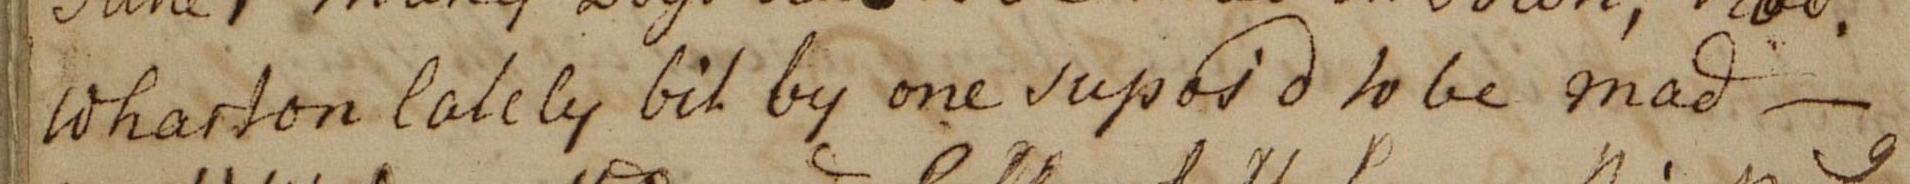Wharton lately bit by one supos'd to be mad-
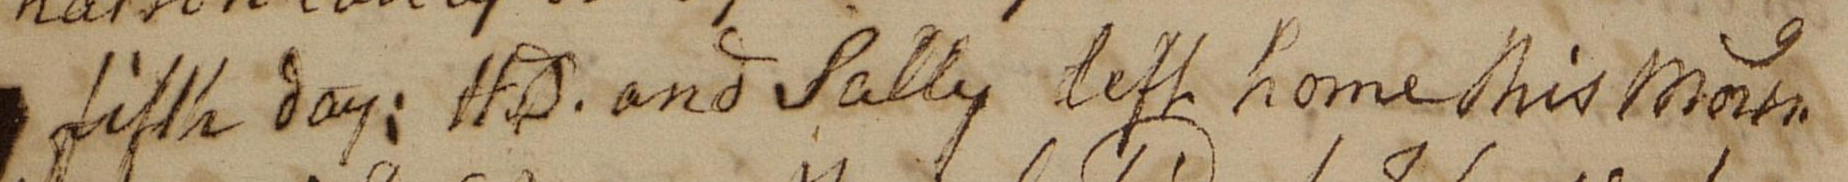fifth day; HD and Sally left home this Morn^g
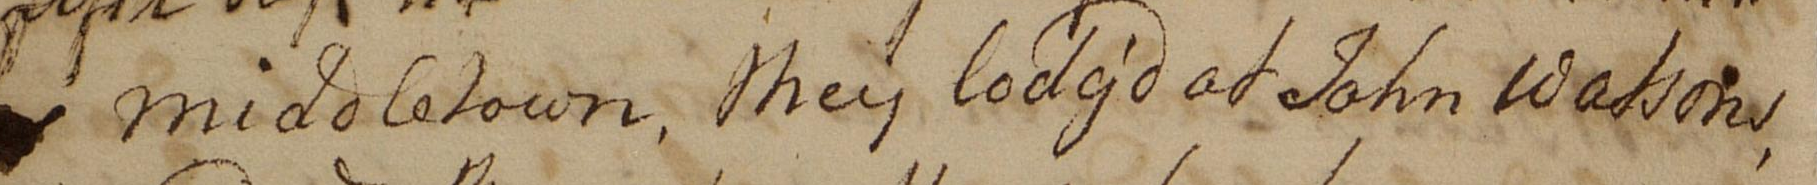Middletown, they lodg'd at John Watsons,
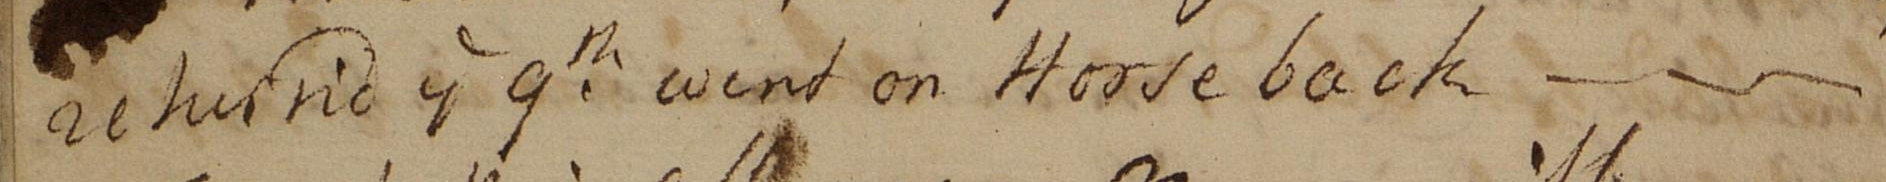return'd y^e 9^th went on Horse back--
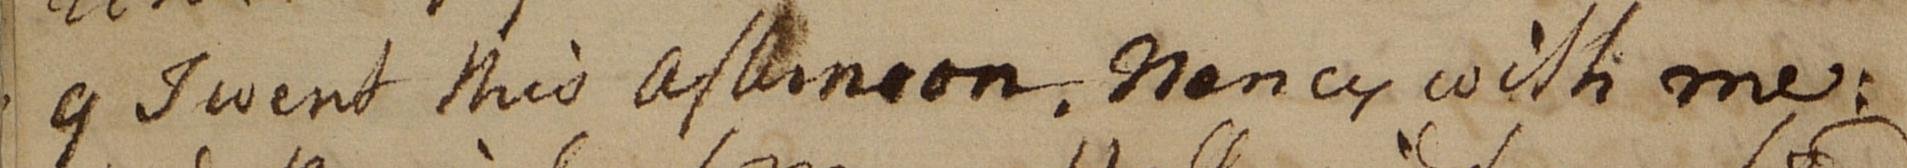9 I went this afternoon, Nancy with me:
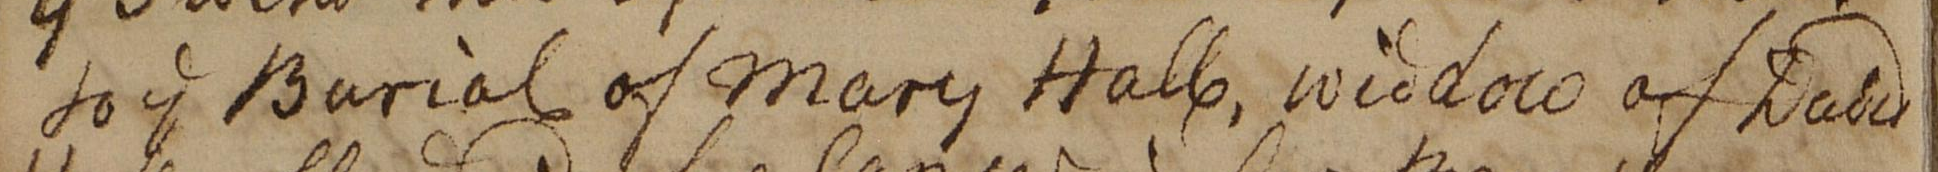to y^e Burial of Mary Hall, widdow of [Daber]
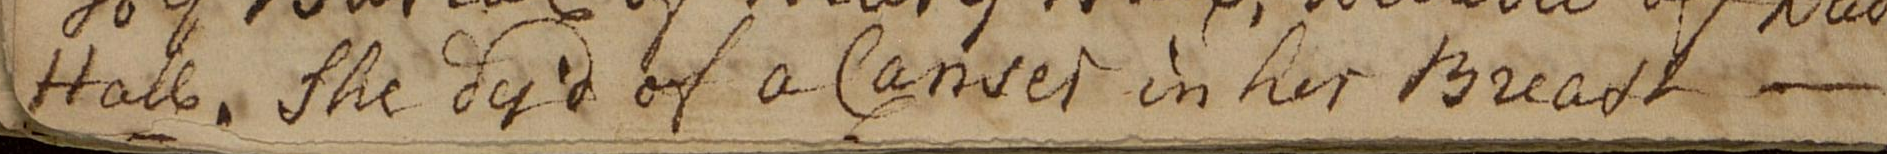Hall, She dy'd of a Canser in her Breast-
